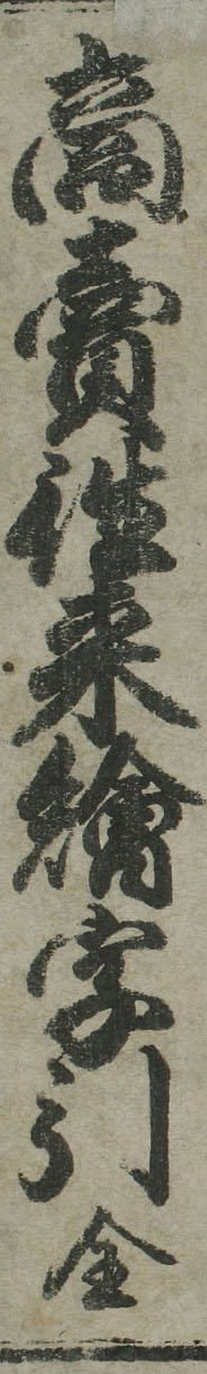商売往来絵地引全

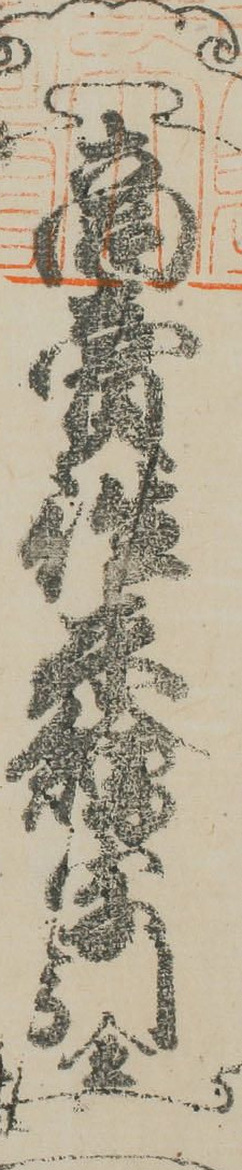商売往来絵字引全
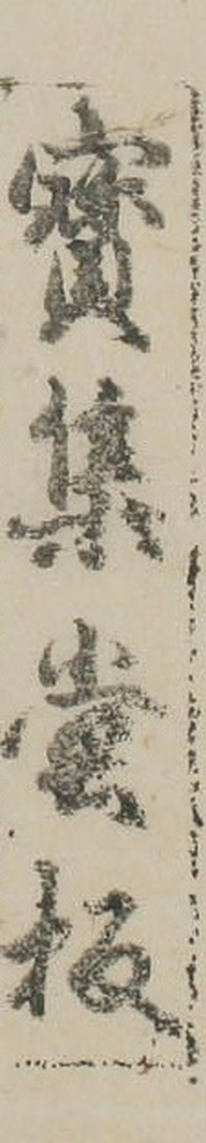宝集堂板
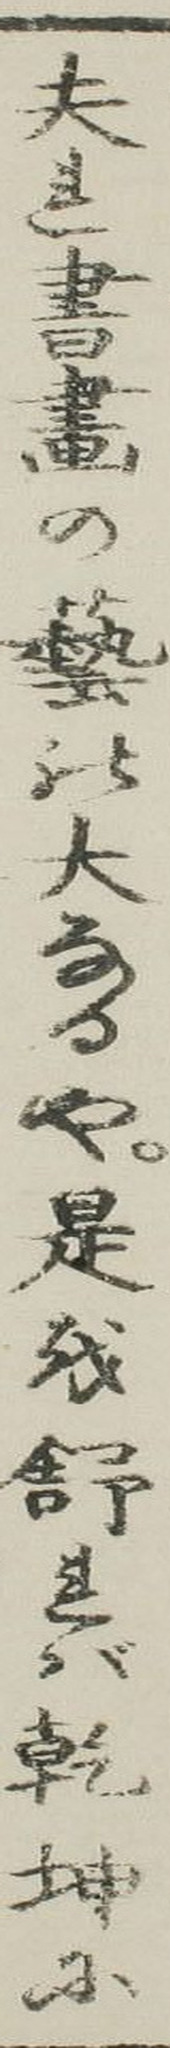夫れ書画の芸の大なるや。是を舒れば乾坤に
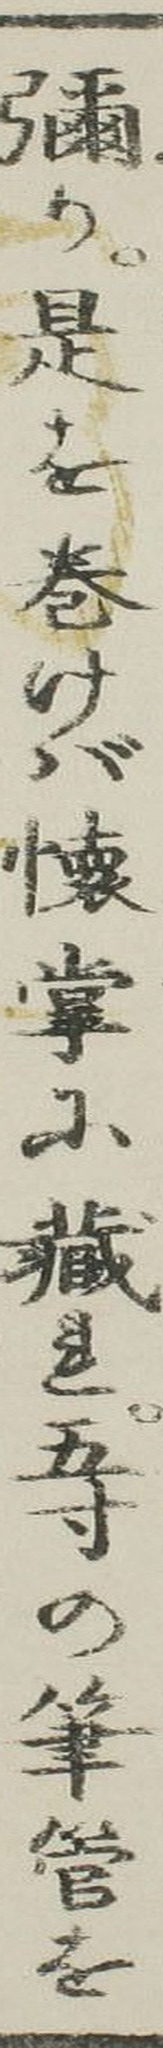弥り。是を巻けば懐掌に蔵れ。五寸の筆管を
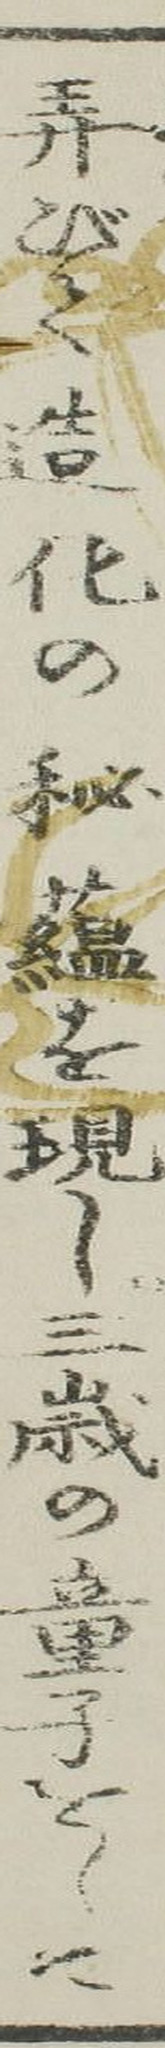弄びて造化の秘蘊を現し三歳の童子をして
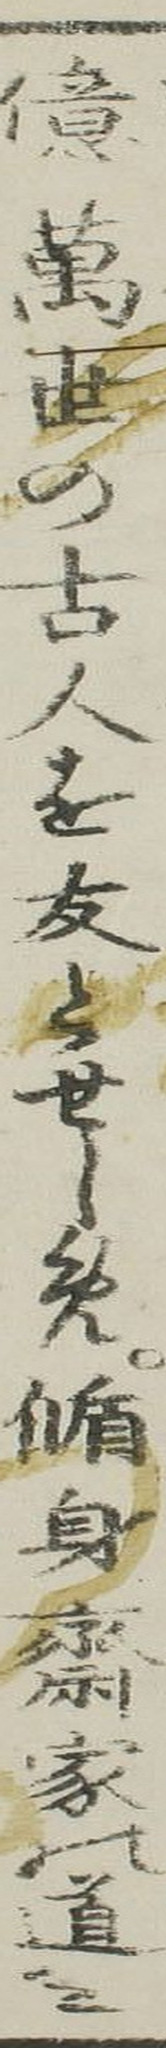億万世の古人を友とせしめ。修身斎家の道を
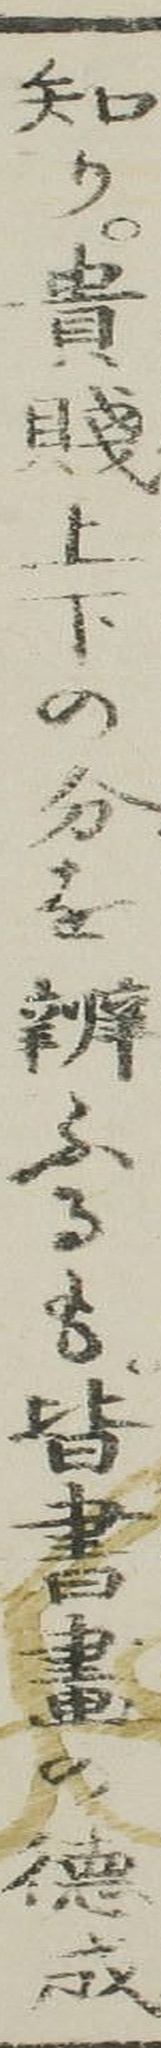知り。貴賤上下の分を弁ふるも。皆書画の徳成
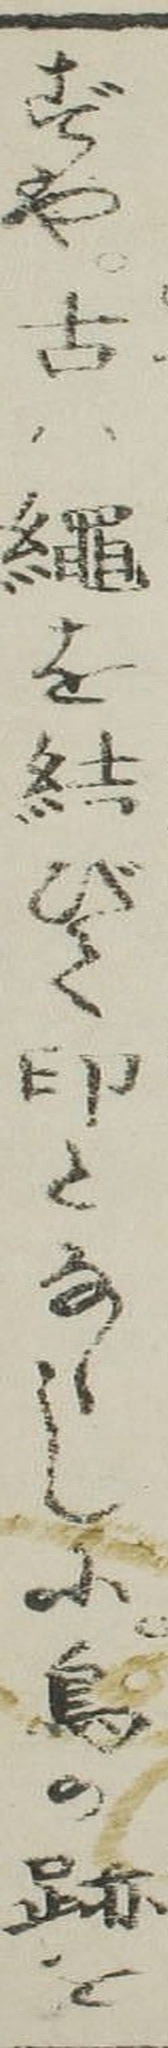ずや。古は縄を結びて印となしに。鳥の跡を
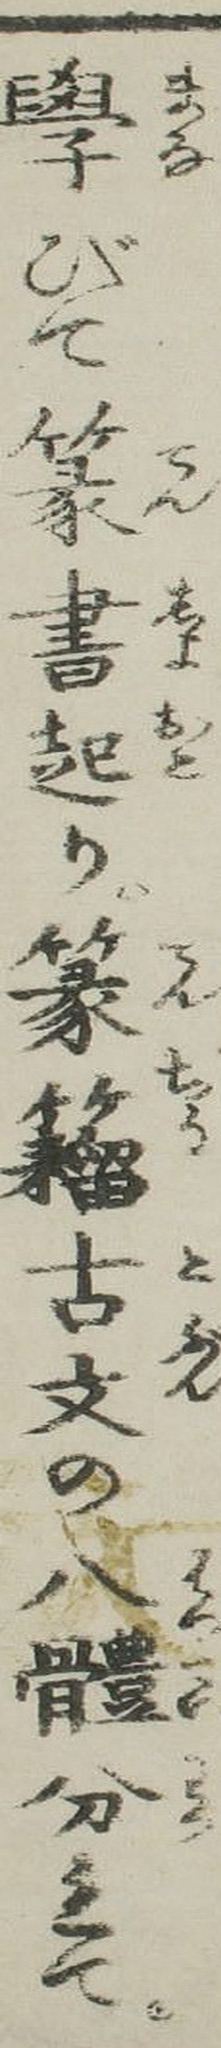学びて篆書起り。篆籒古文の八体分れて。

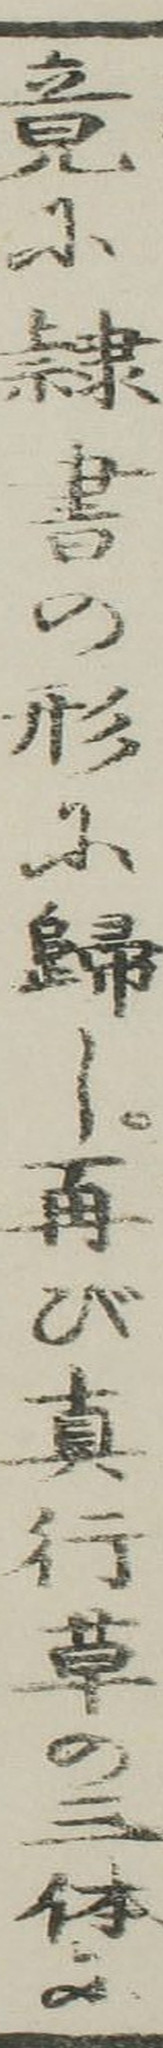竟に隷書の形に帰し。再び真行草の三体に
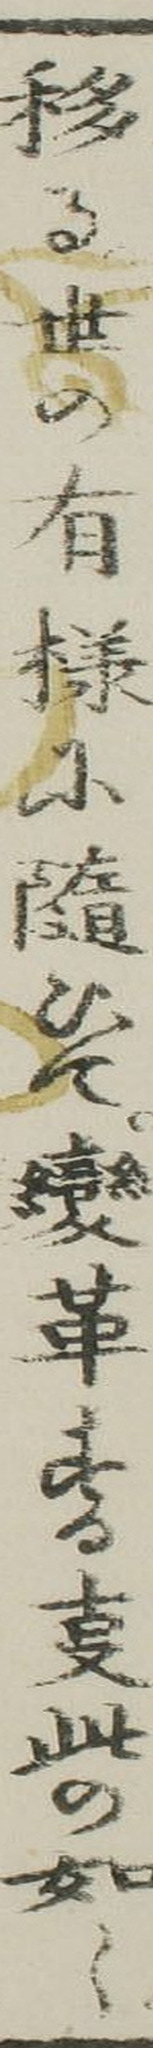移る世の有様に随ひて。変革する事此の如し
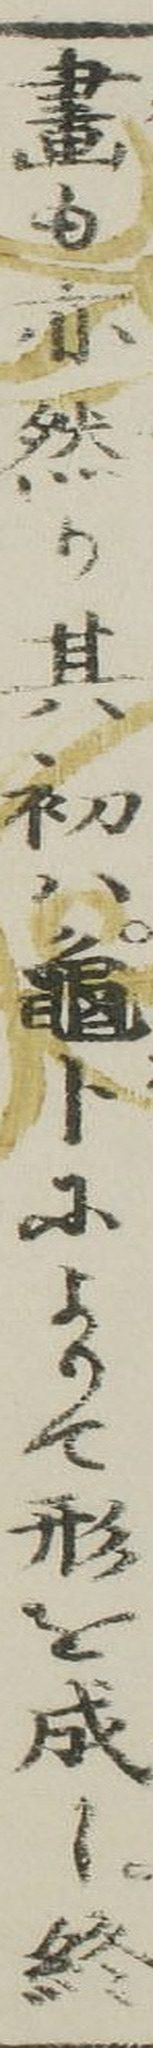画も亦然り其初は。亀卜によりて形を成し。終
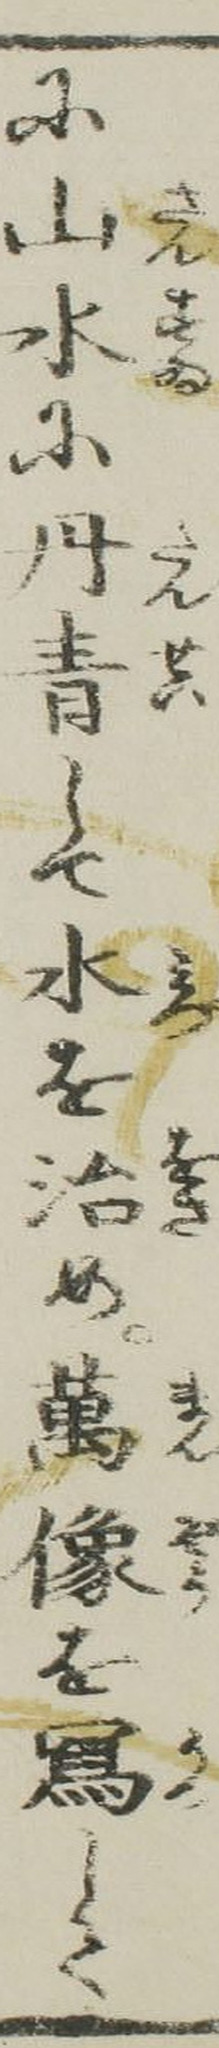に山水に丹青して水を治め。万像を写して
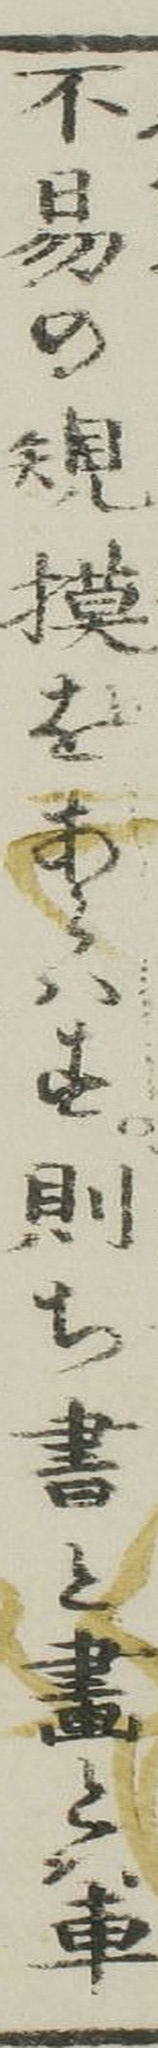不易の規模をあらはす。則ち書と画とは車
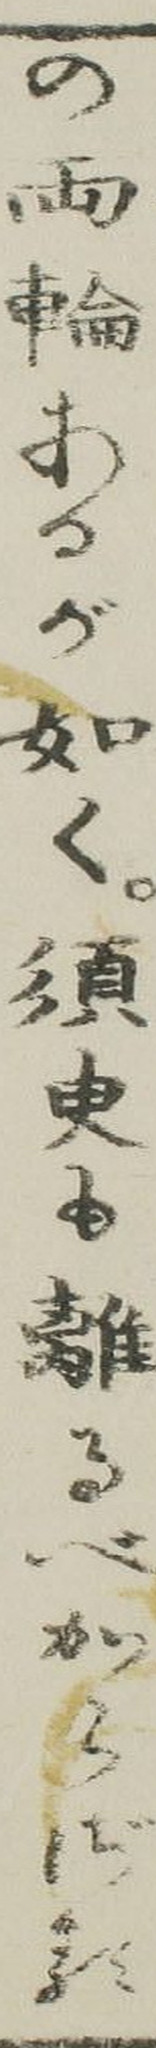の両輪あるが如く。須臾も離るべからざる
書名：商売往来絵字引
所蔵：東京学芸大学教育コンテンツアーカイブ
